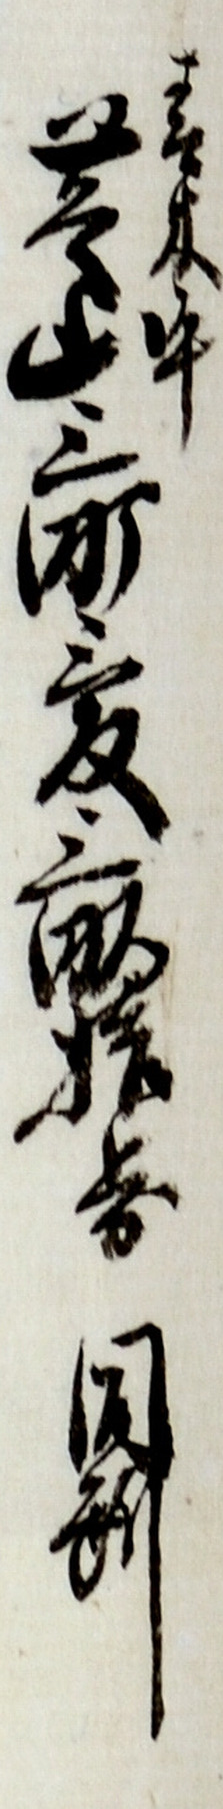芝山三町三反三畝拾歩同断
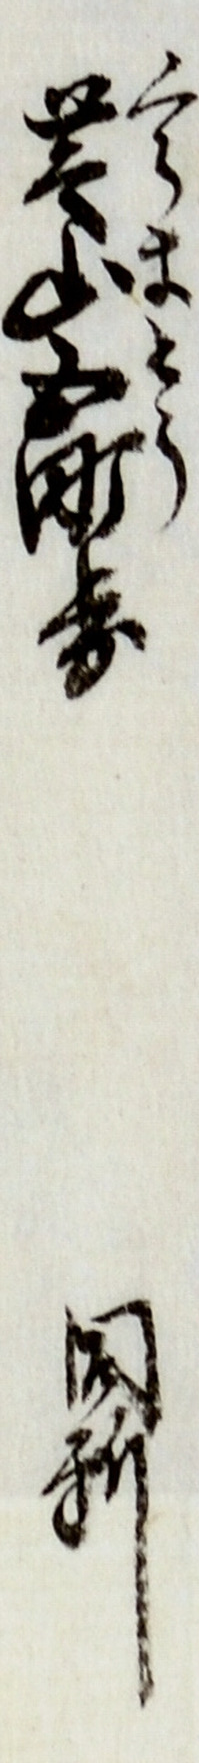芝山五町歩同断
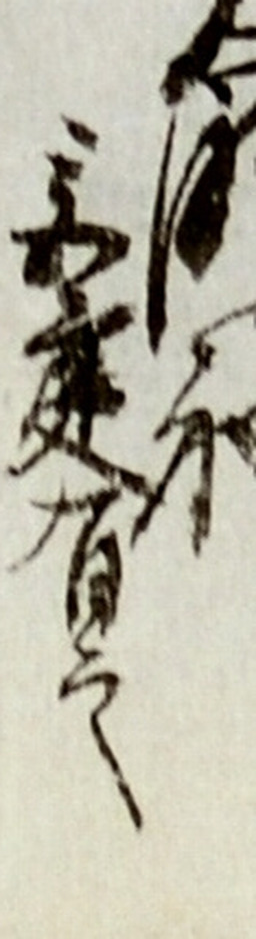宮建有之
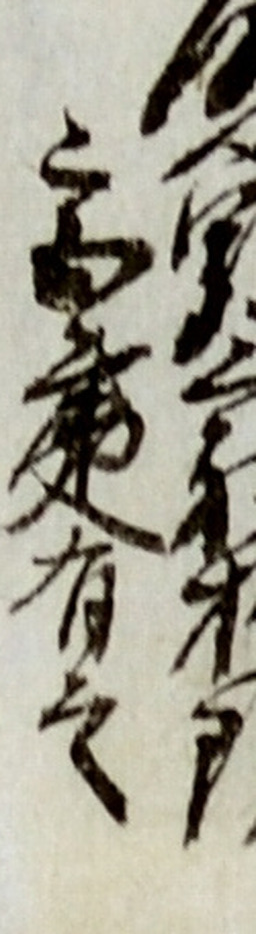宮建有之
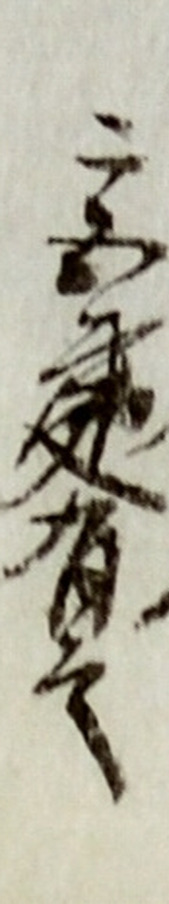宮建有之

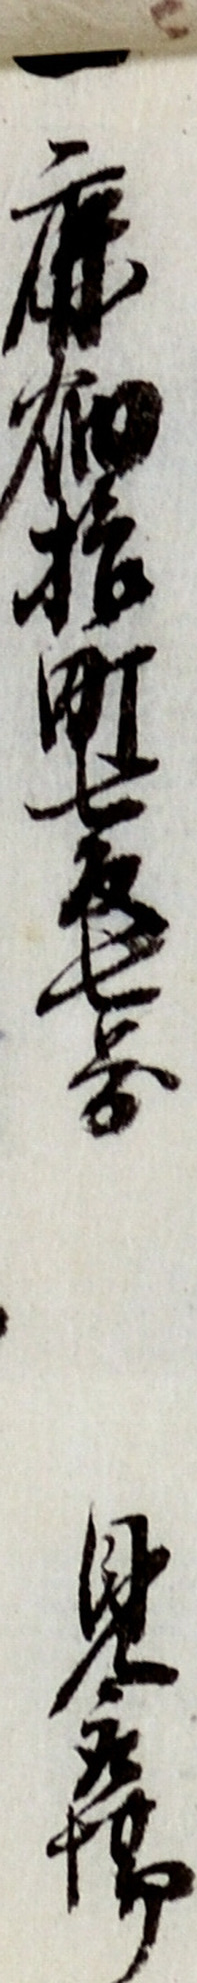一麻畑拾町七反七歩見取場
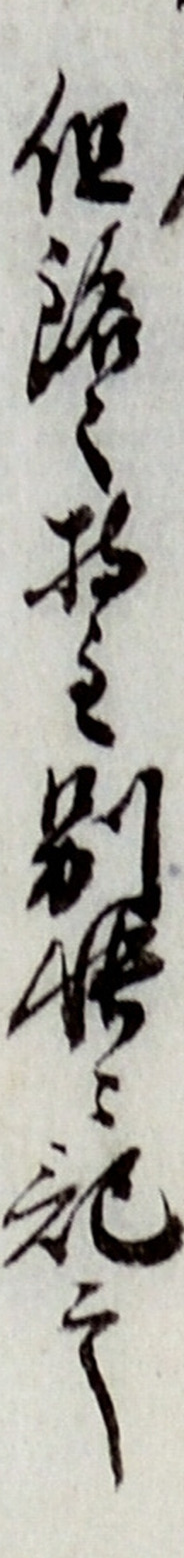但銘々持主別帳ニ記之
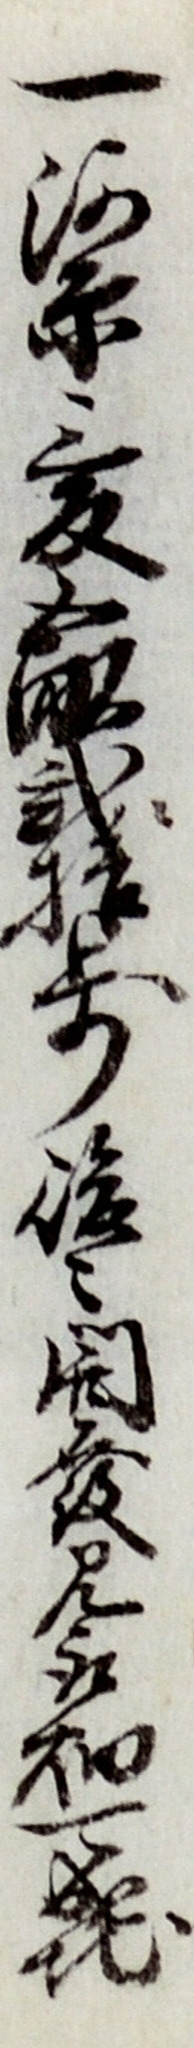一河原三反五畝弐拾歩後々開発見取畑可成地
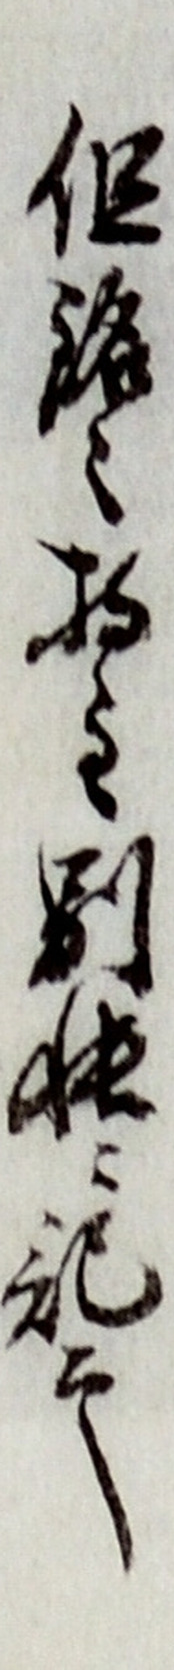但銘々持主別帳ニ記之
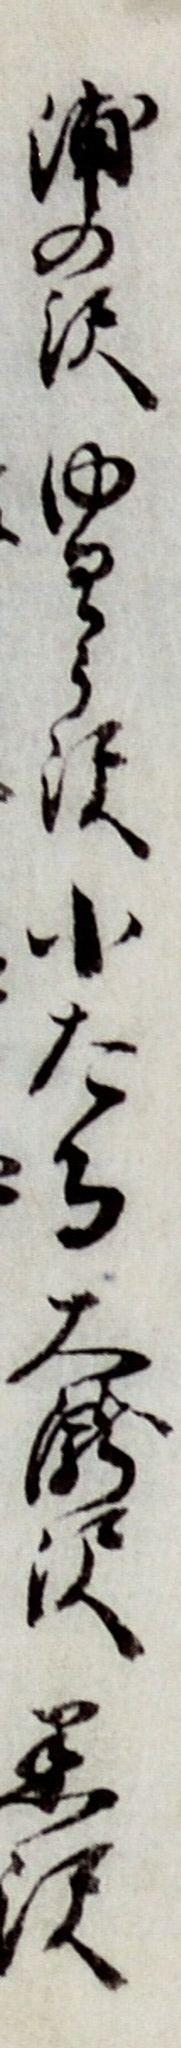浦の沢ゆりう沢小たる大滝沢黒沢

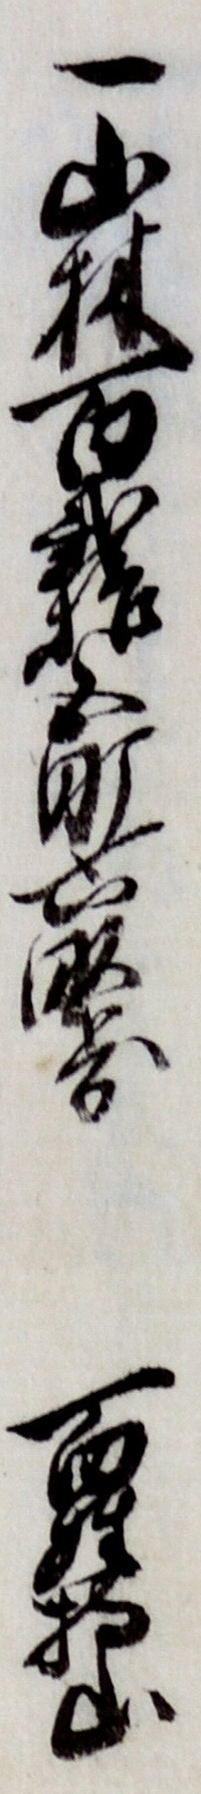一山林百弐拾五町六畝歩百姓持山
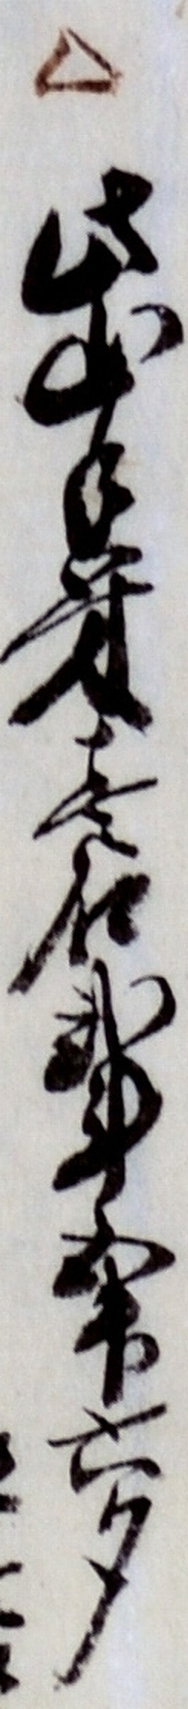△此山手米壱石弐斗五升六勺
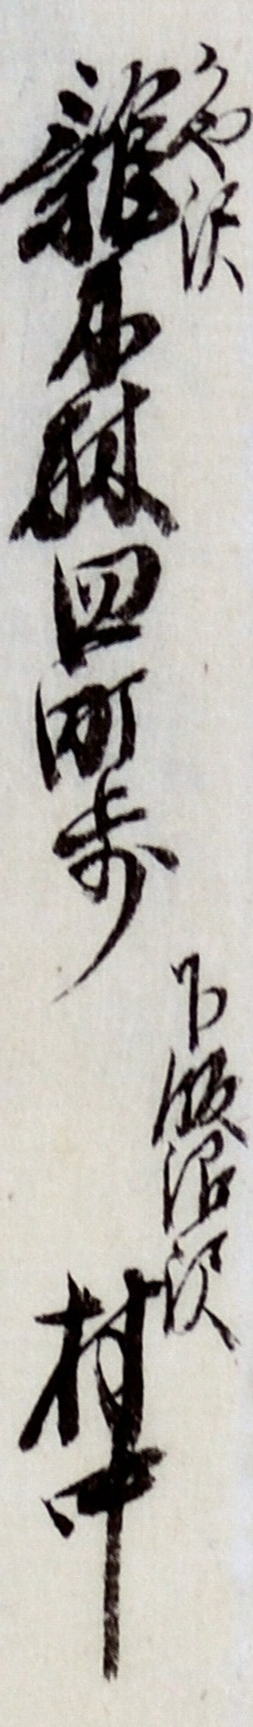雑木林四町歩村中
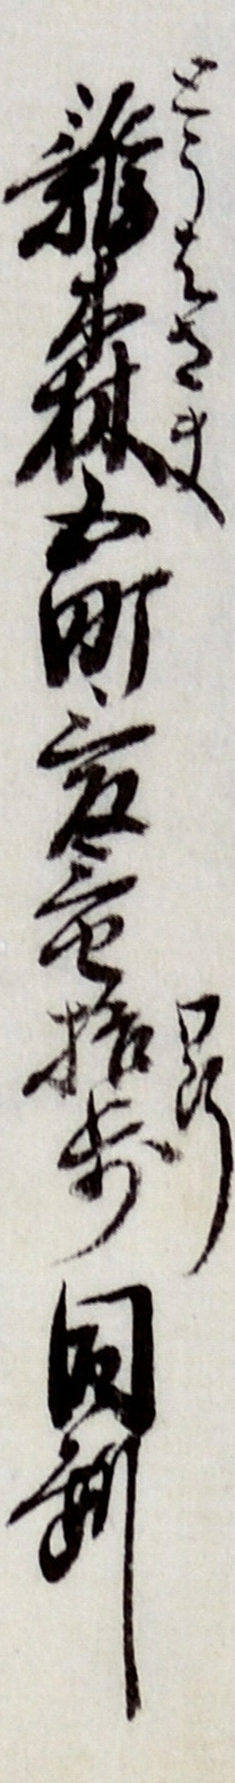雑木林五町三反三セ拾歩同断
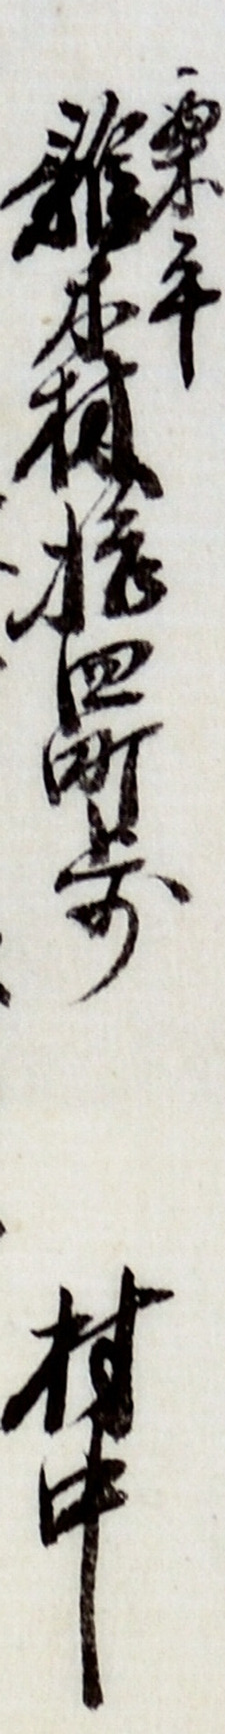雑木林拾四町歩村中
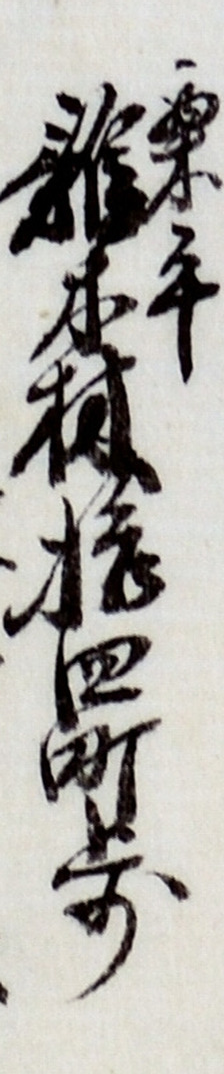雑木林拾四町歩村中
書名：御領分中山林社地手控
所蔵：伊那市立高遠町図書館・合同会社AMANE
